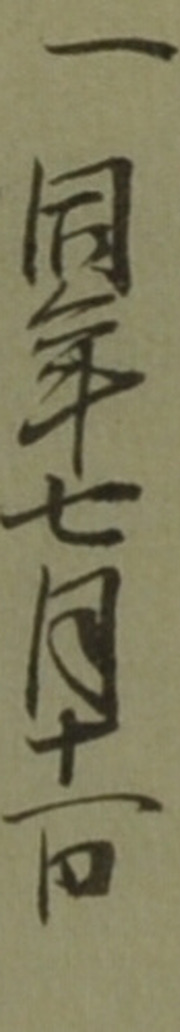一同年七月十一日
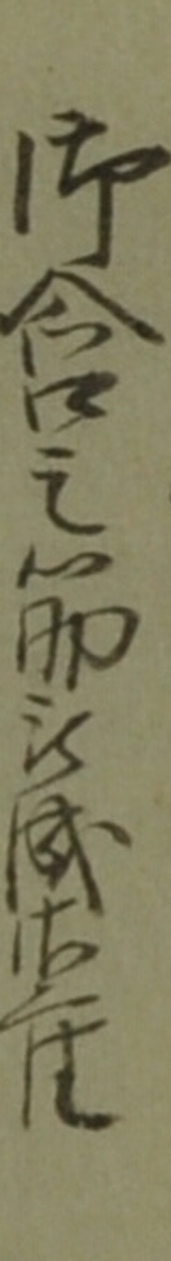御含之筋被成御座
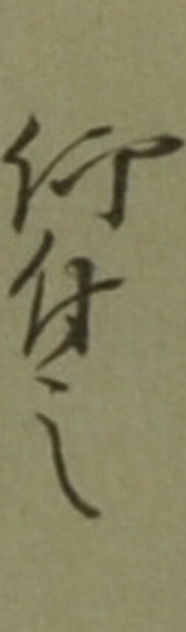仰付之
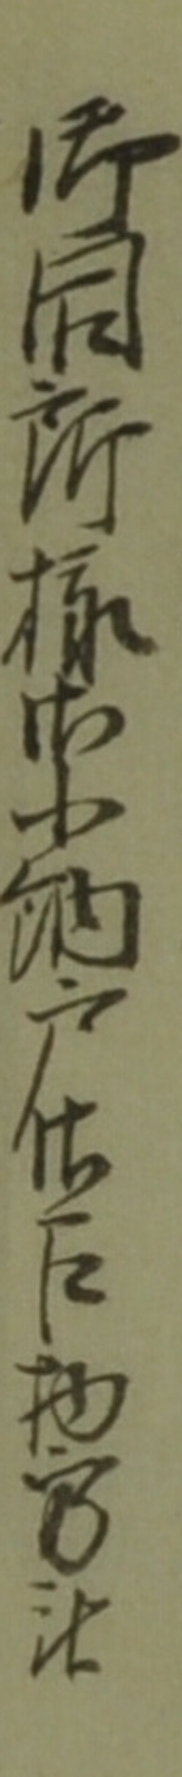御同所様御小納戸御召物方被
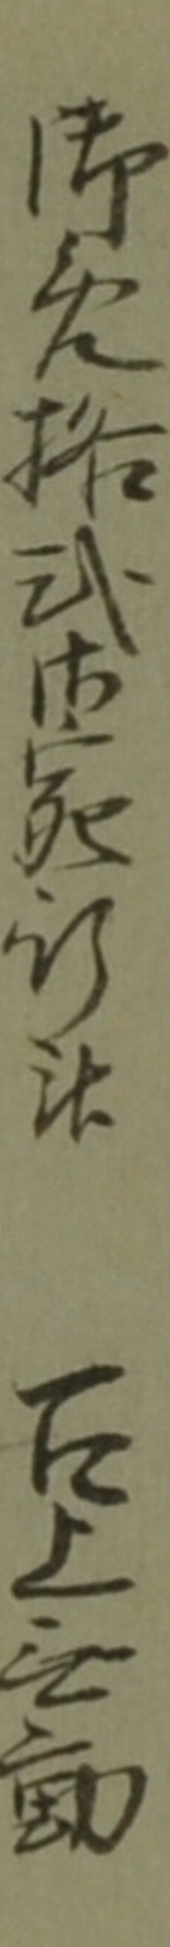御免格式御宛行被召上無勤
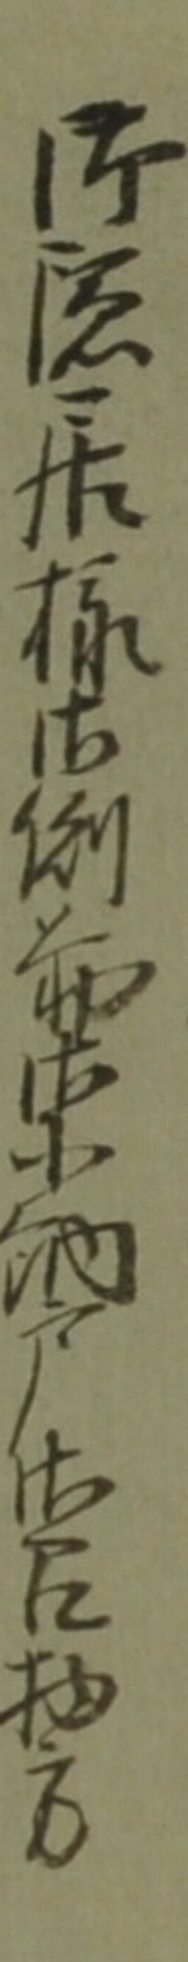御隠居様御側勤御小納戸御召物方
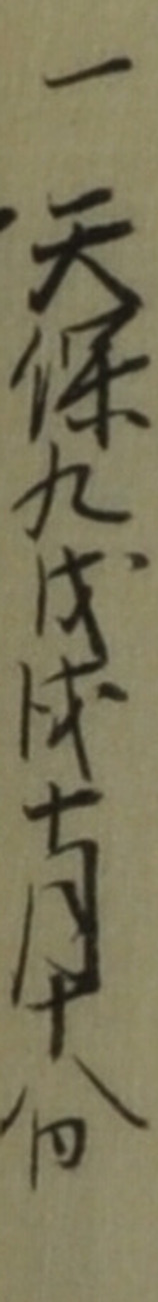一天保九戊戌七月十八日
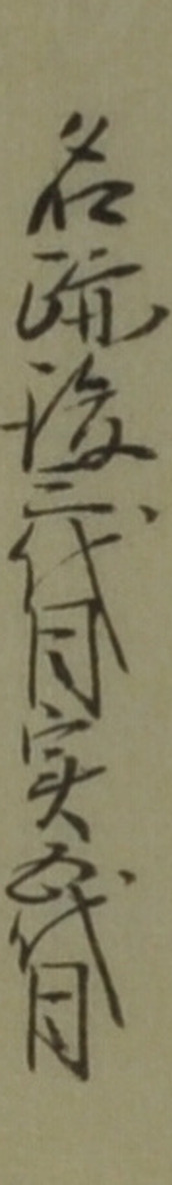名跡後二代目実五代目
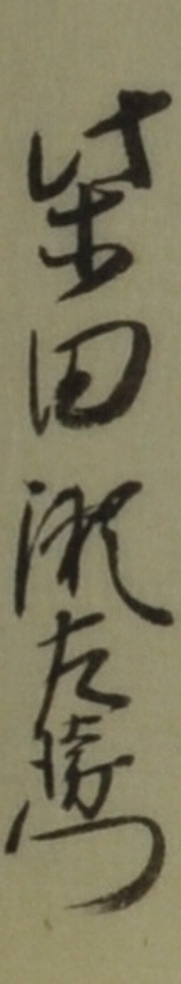柴田瀬左衛門
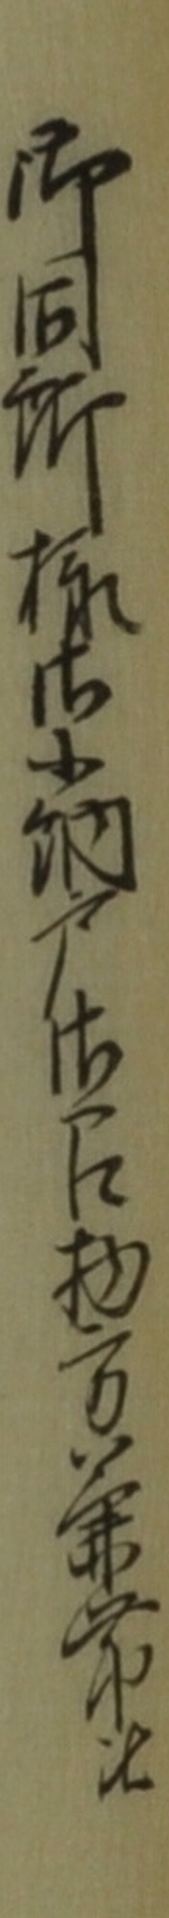御同所様御小納戸御召物方兼帯被
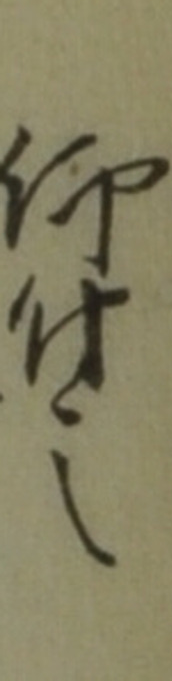仰付之
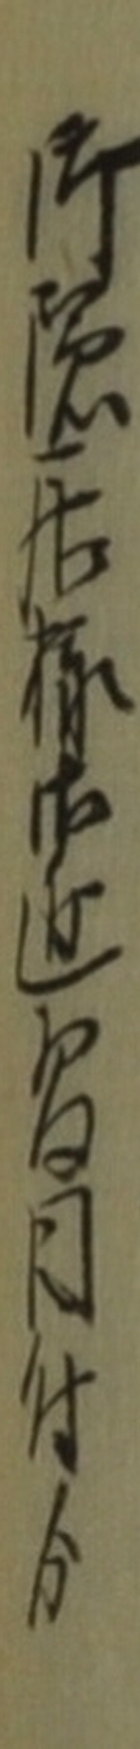御隠居様御近習目付ゟ
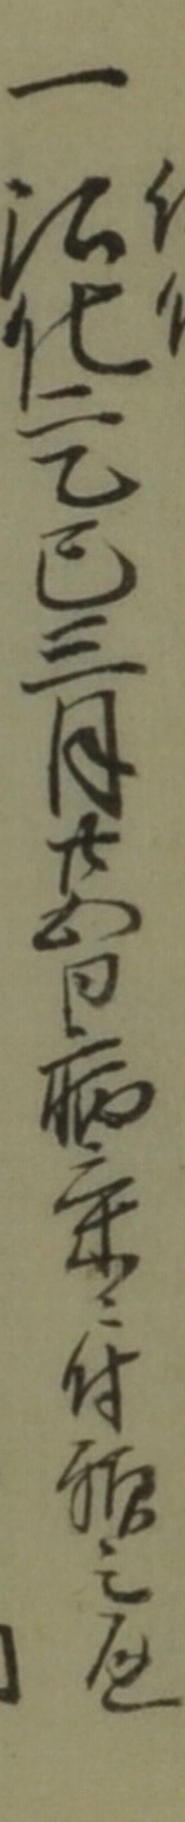一弘化二乙巳三月廿五日病気ニ付願之通
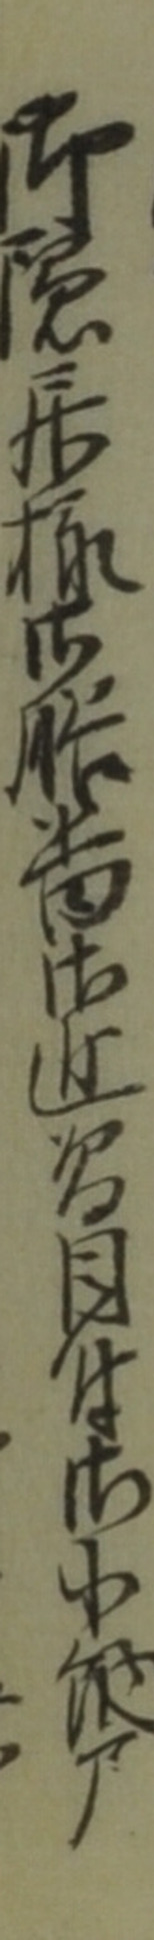御隠居様御膳番御近習目付御小納戸
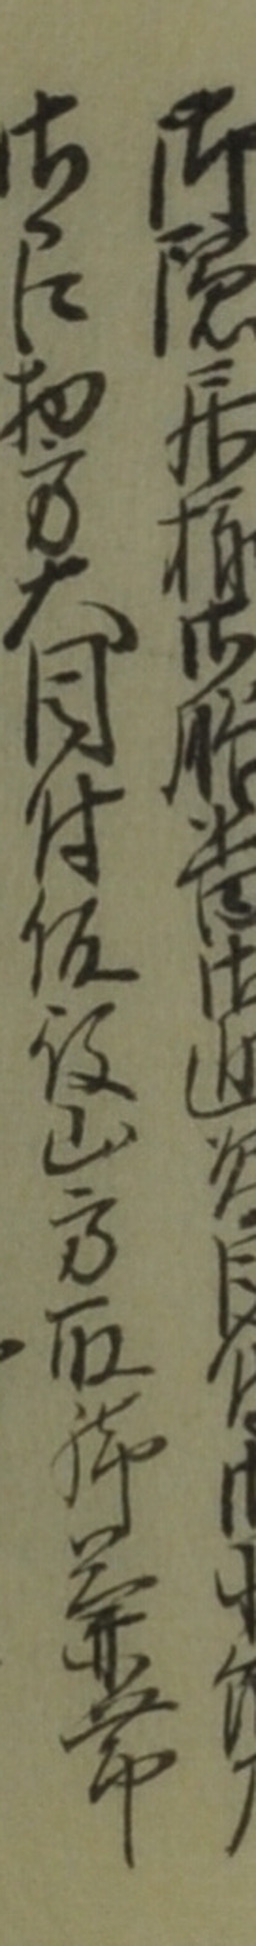御召物方大目付仮役山方取締兼帯
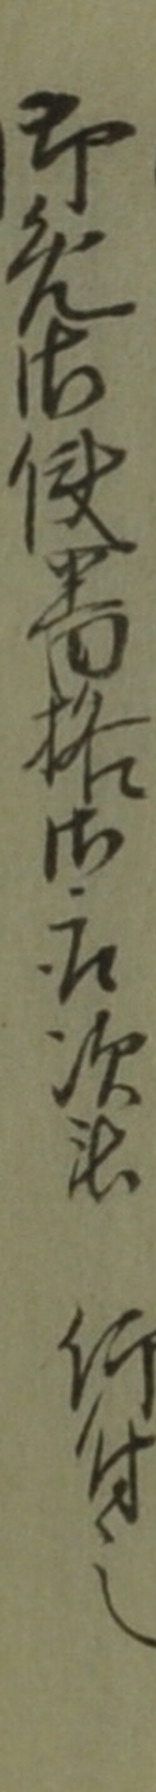御免御使番格御取次被仰付之
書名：諸御役代々録（四）
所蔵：伊那市立高遠町図書館・合同会社AMANE
